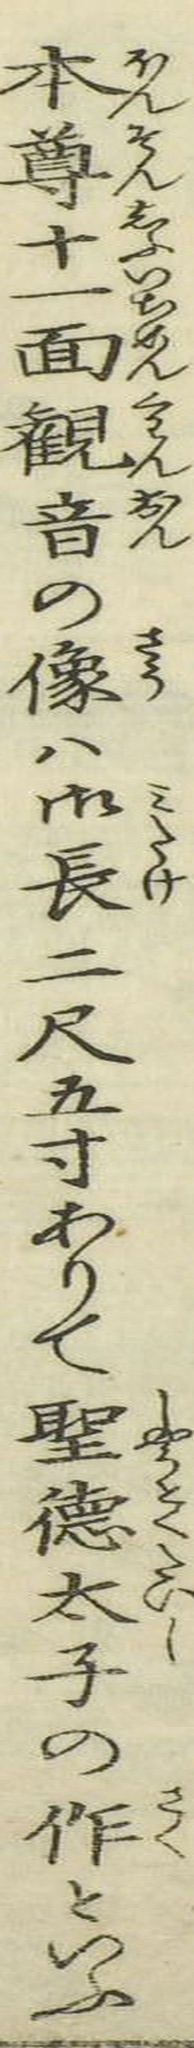本尊十一面観音の像は御長二尺五寸ありて聖徳太子の作といふ
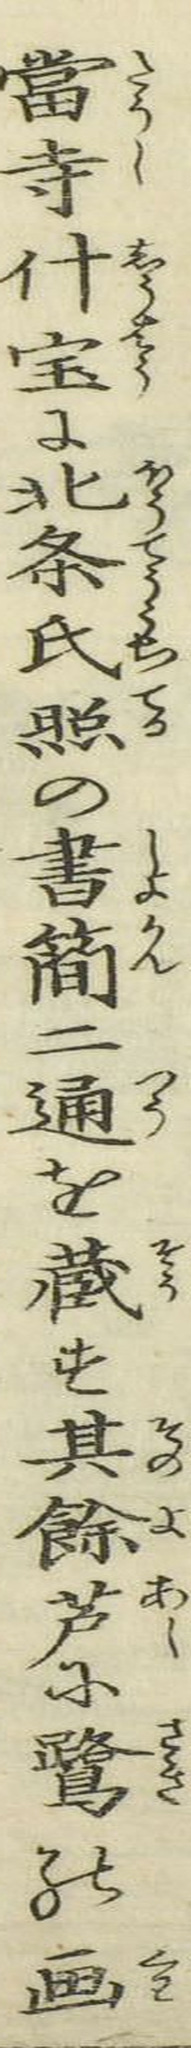当寺什宝に北条氏照の書簡二通を蔵す其余芦に鷺の画
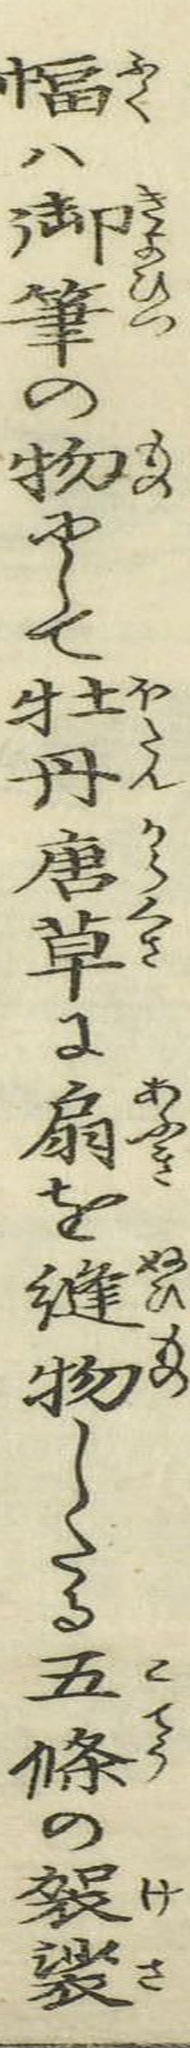幅は御筆の物にして牡丹唐草に扇を縫物したる五條の袈裟
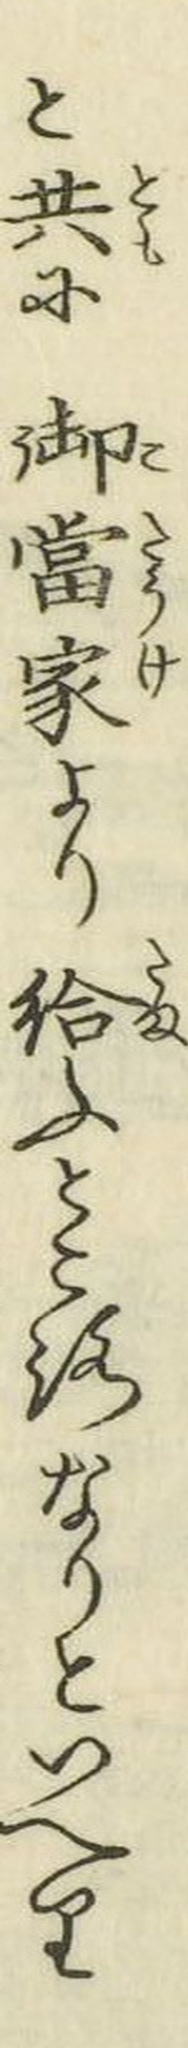と共に御当家より給ふところなりといへり
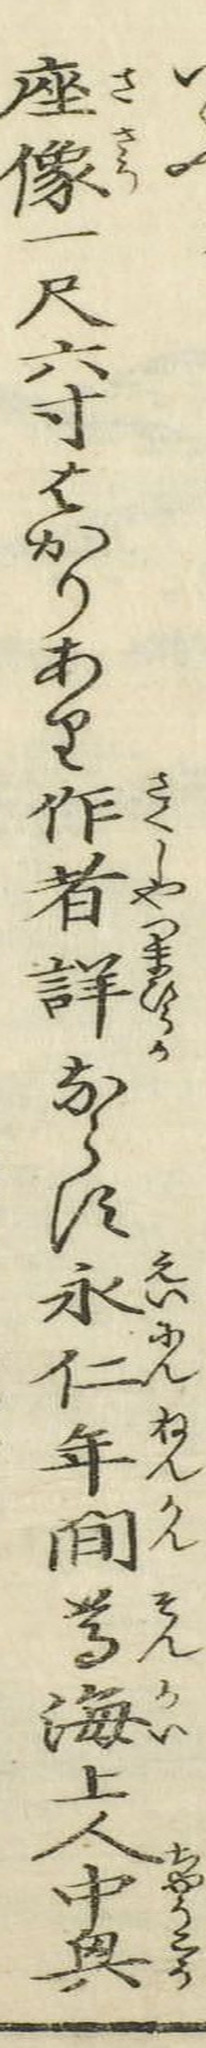座像一尺六寸はかりあり作者詳ならす永仁年間尊海上人中興
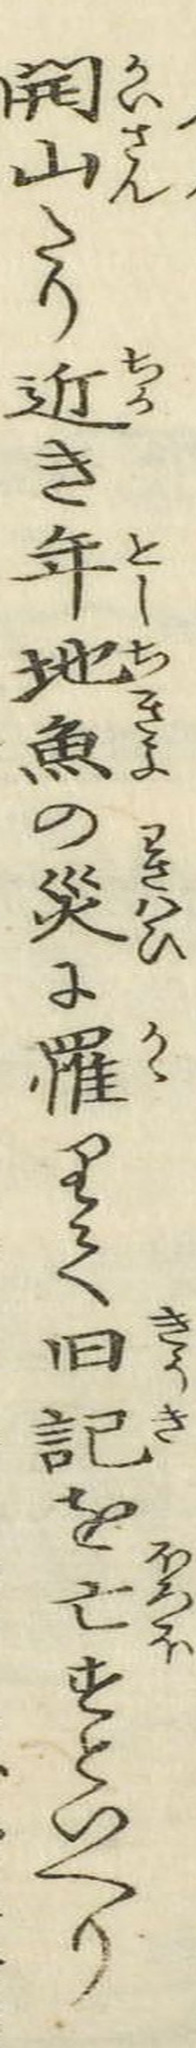開山たり近き年地魚の災に罹りて旧記を亡すといへり
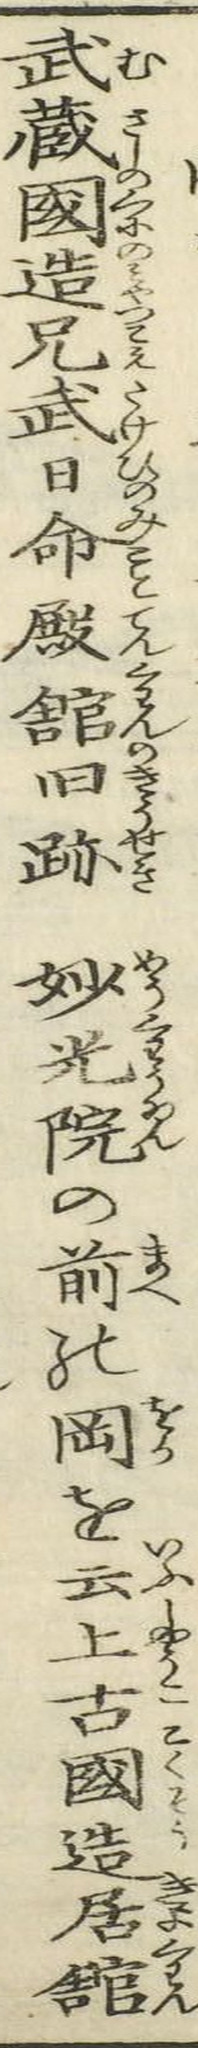武蔵国造兄武日命殿館旧跡妙光院の前の岡を云上古国造居館
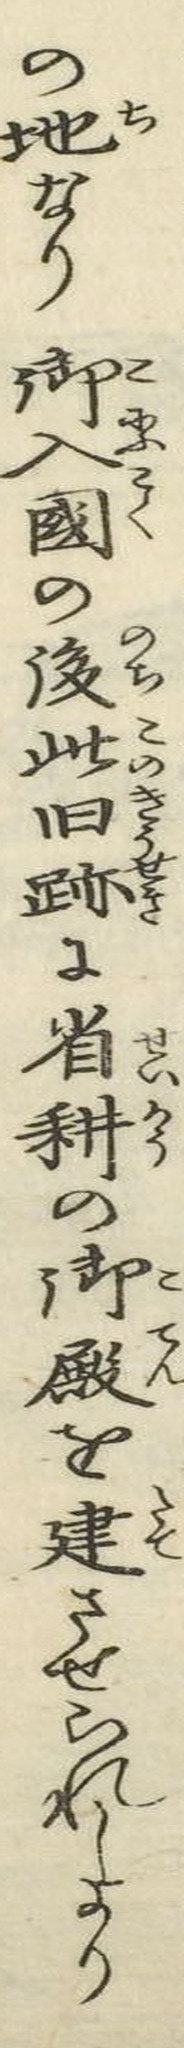の地なり御入国の後此旧跡に省耕の御殿を建させられしより
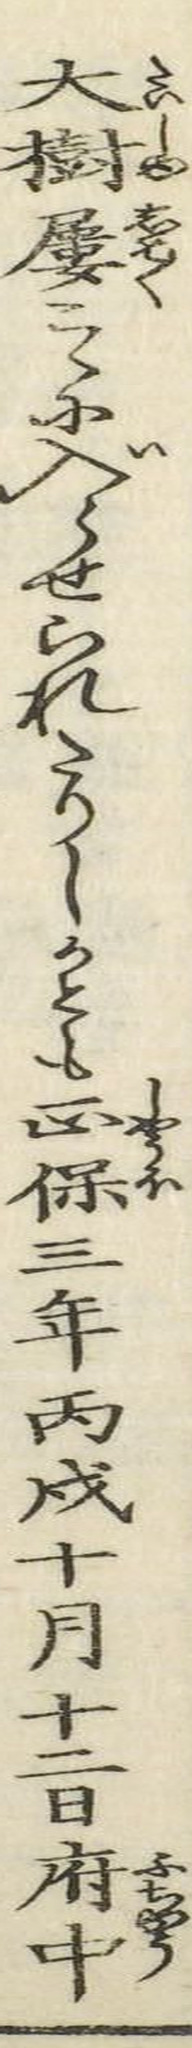大樹屡こゝに入らせられたりしかとも正保三年丙戌十月十二日府中
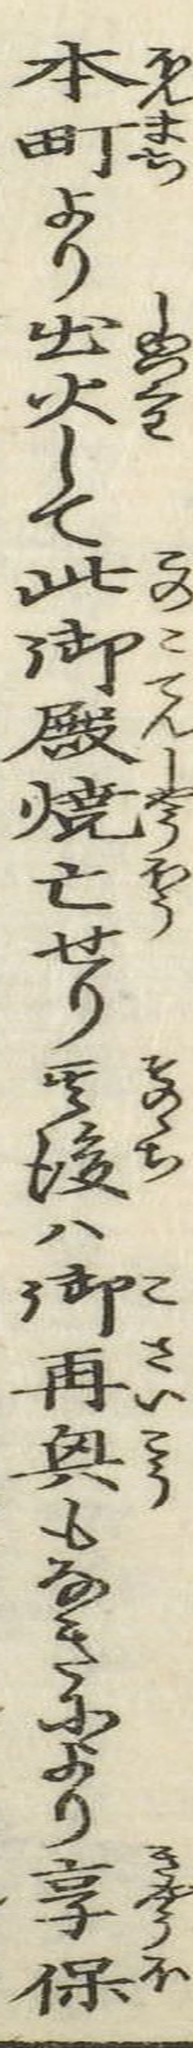本町より出火して此御殿焼亡せり其後は御再興もなきにより享保
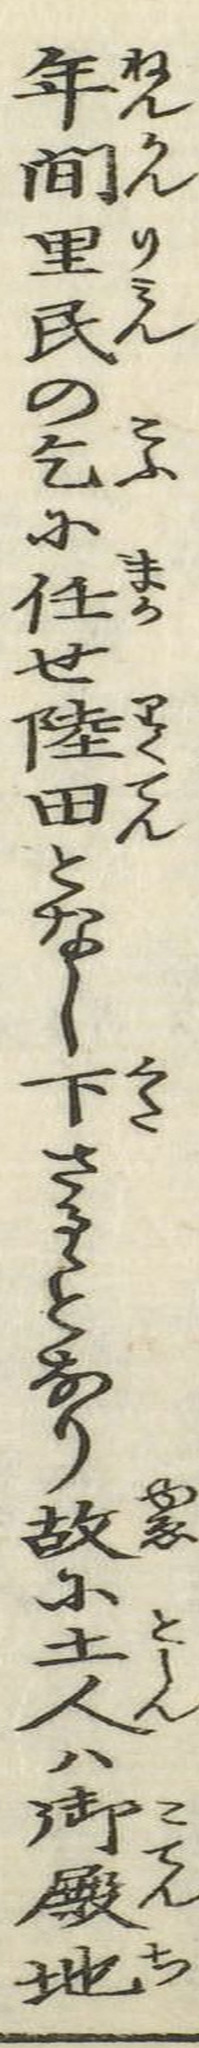年間里民に乞に任せ陸田となし下さるゝとなり故に土人は御殿地
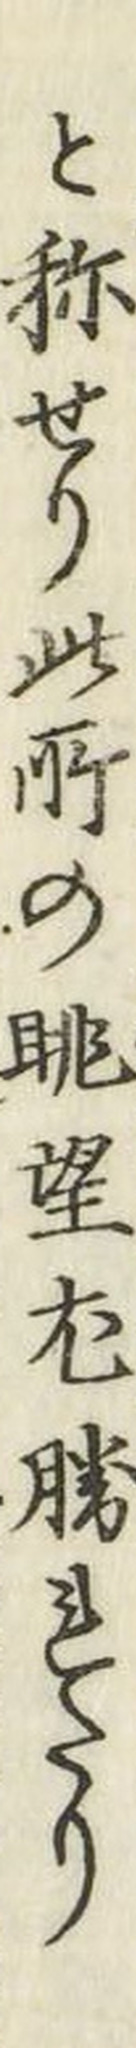と称せり此所の眺望尤勝れたり
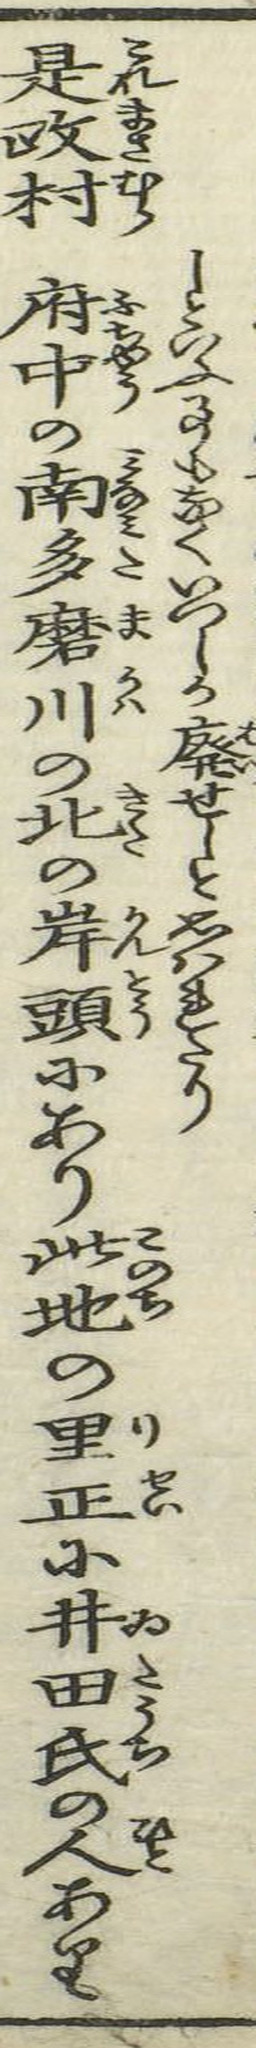是政村府中の南多磨川の北の岸頭にあり此地の里正に井田氏の人あり
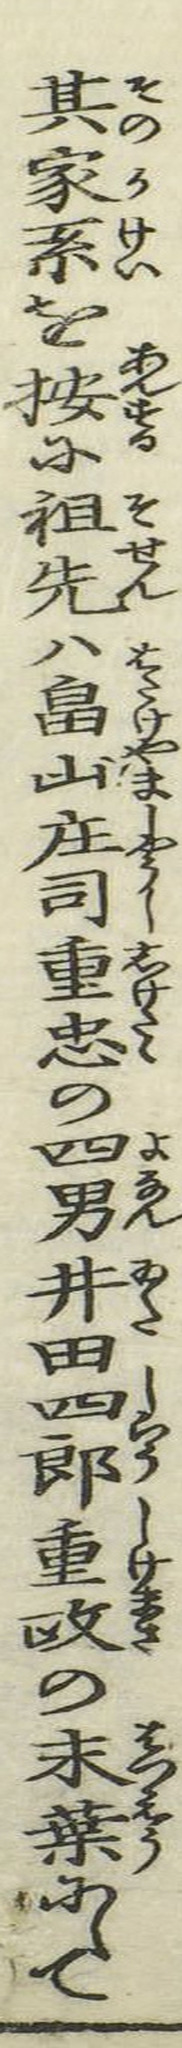其家系を按に祖先は畠山庄司重忠の四男井田四郎重忠の末葉にして
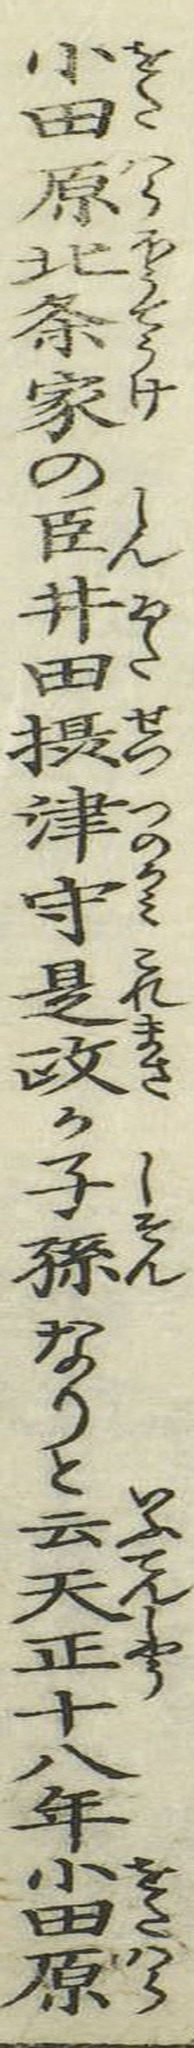小田原北条家の臣井田攝津守是政か子孫なりと云天正十八年小田原
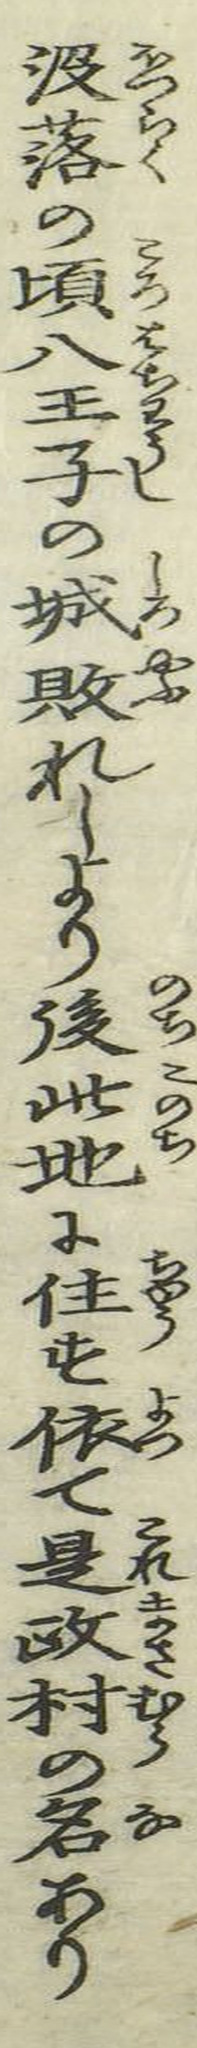没落の頃八王子の城敗れしより後此地に住す依て是政村の名あり
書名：江戸名所図会 20巻 巻之10
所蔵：東京学芸大学教育コンテンツアーカイブ
